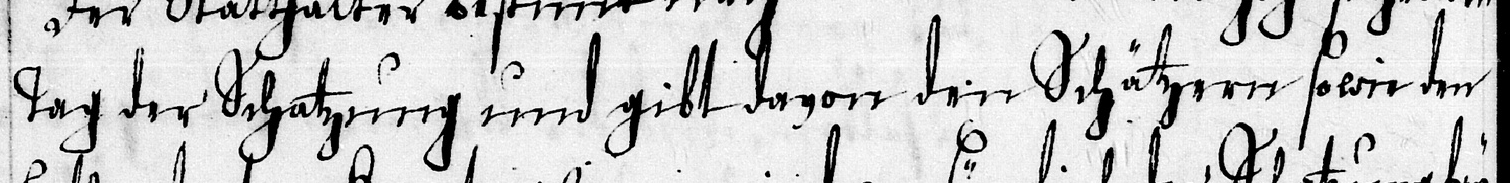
Tag der Schatzung und gibt davon den Schätzern sowie den
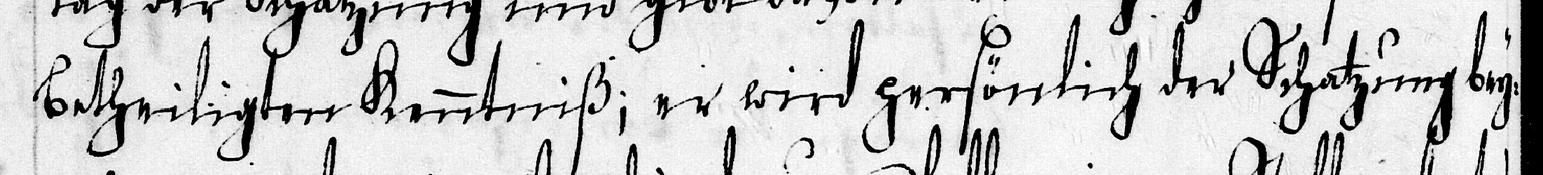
Betheiligten Kenntniß; er wird persönlich der Schatzung bey¬
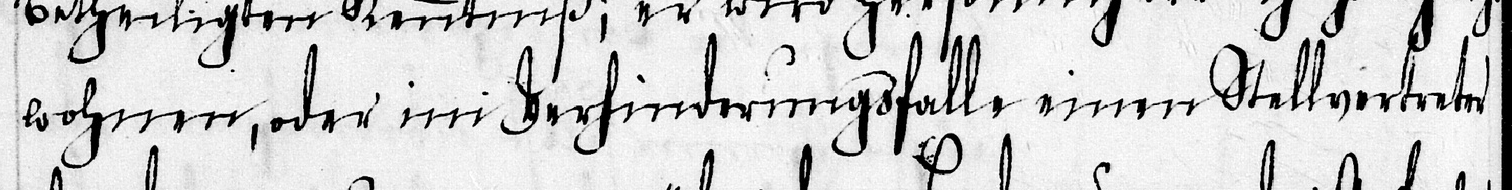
wohnen, oder im Verhinderungsfalle einen Stellvertreter
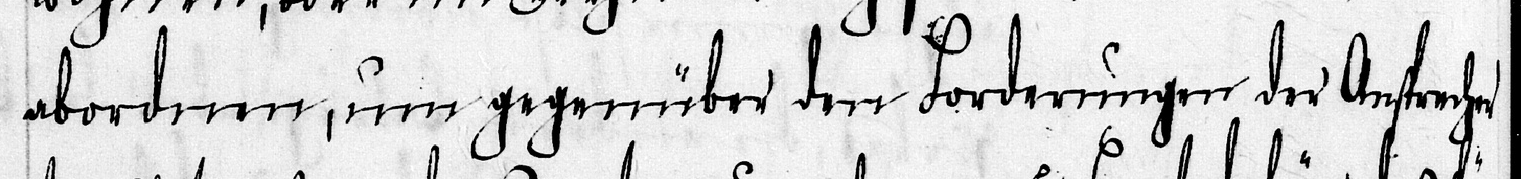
abordnen, um gegenüber den Forderungen der Ansprecher
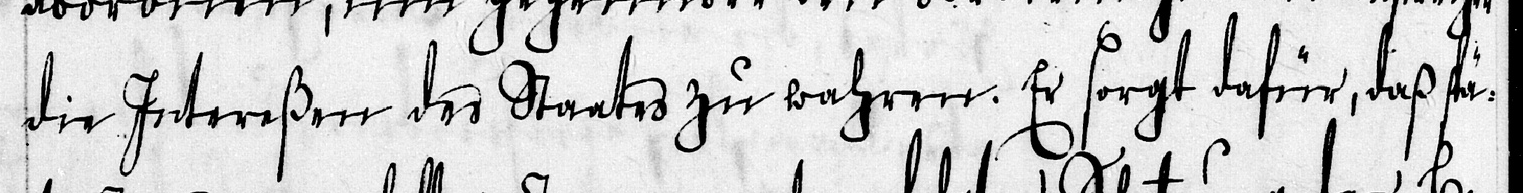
die Intereßen des Staates zu wahren. Er sorgt dafür, daß spä¬
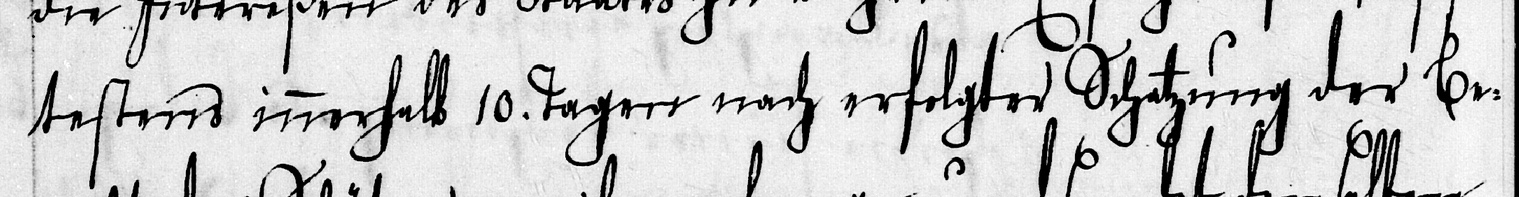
testens innerhalb 10. Tagen nach erfolgter Schatzung der Be¬
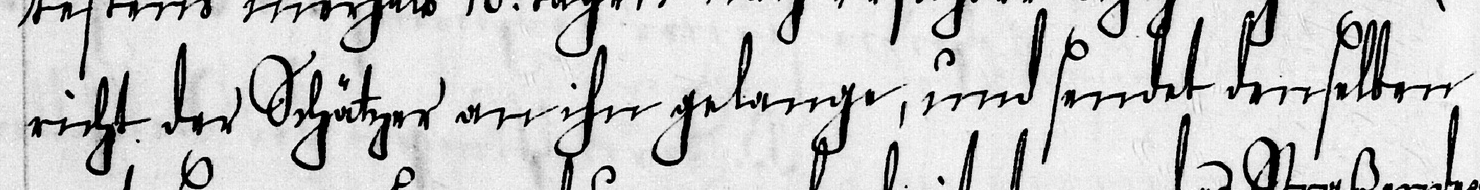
richt der Schätzer an ihn gelange, und sendet denselben
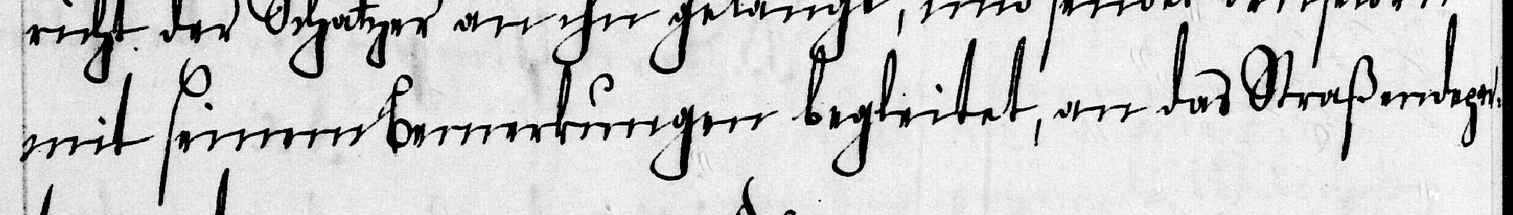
mit seinen Bemerkungen begleitet, an das Straßendep¬
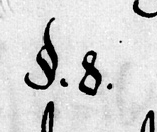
§. 8.
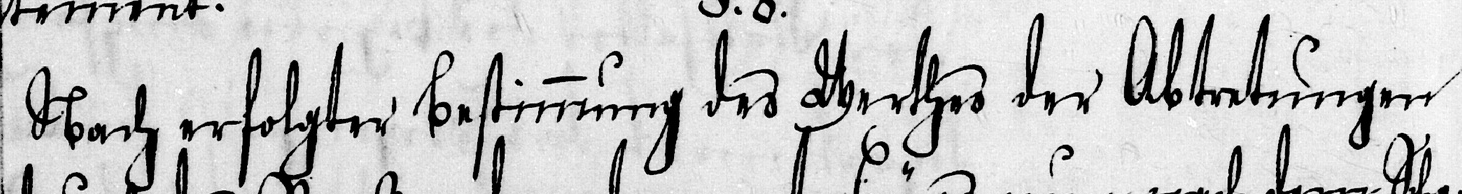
Nach erfolgter Bestimmung des Werthes der Abtretungen
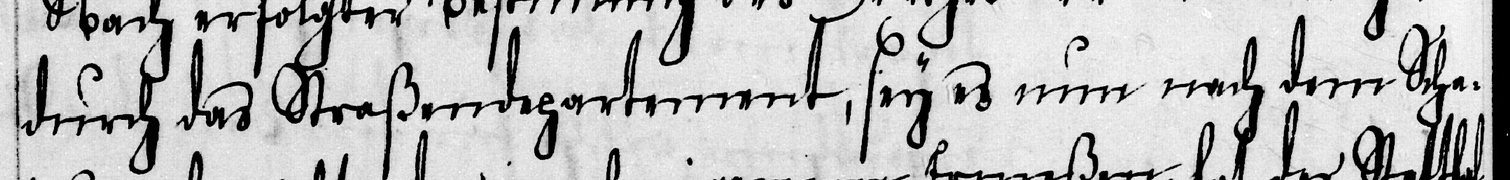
durch das Straßendepartement, sey es nun nach dem Scha¬
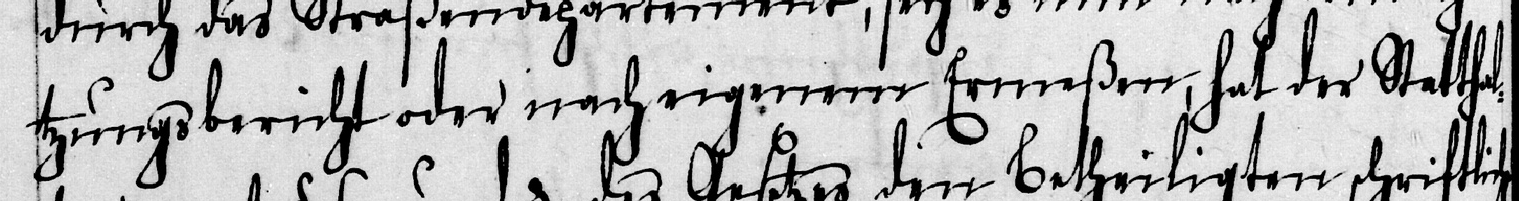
tzungsbericht oder nach eigenem Ermeßen, hat der Statth¬
